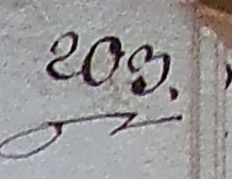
203.
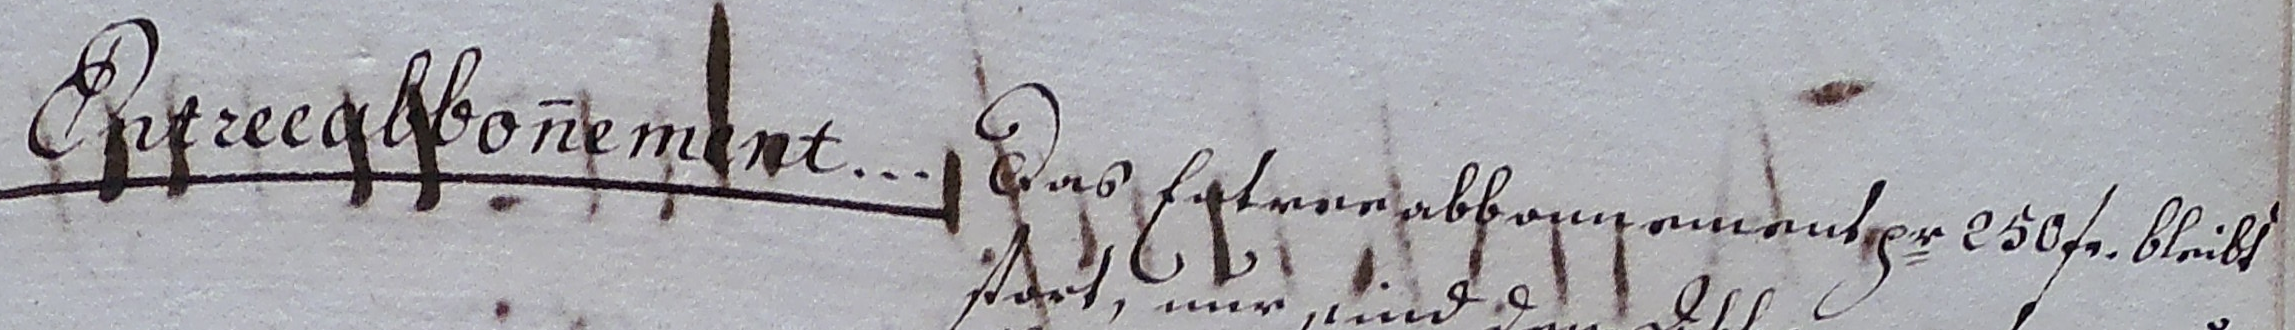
Entreeabbon̅ement. . . Das Entreeabbonement pr͇ 250fr. bleibt
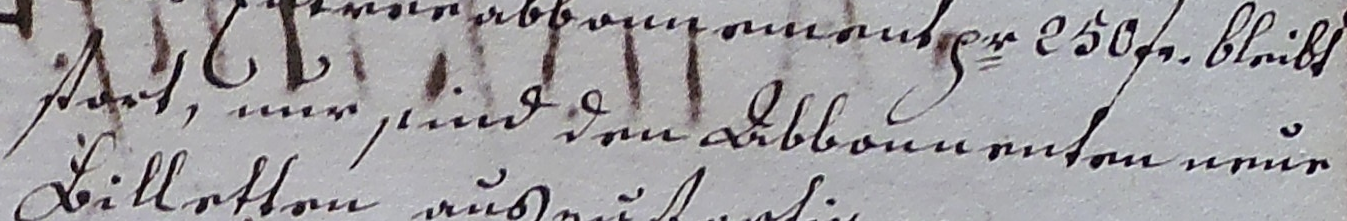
fort, nur sind den Abbonnenten neue
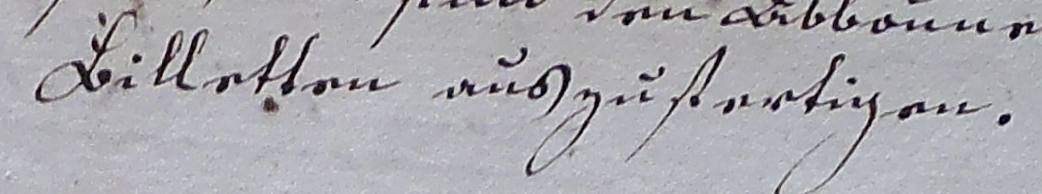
Billetten auszufertigen.
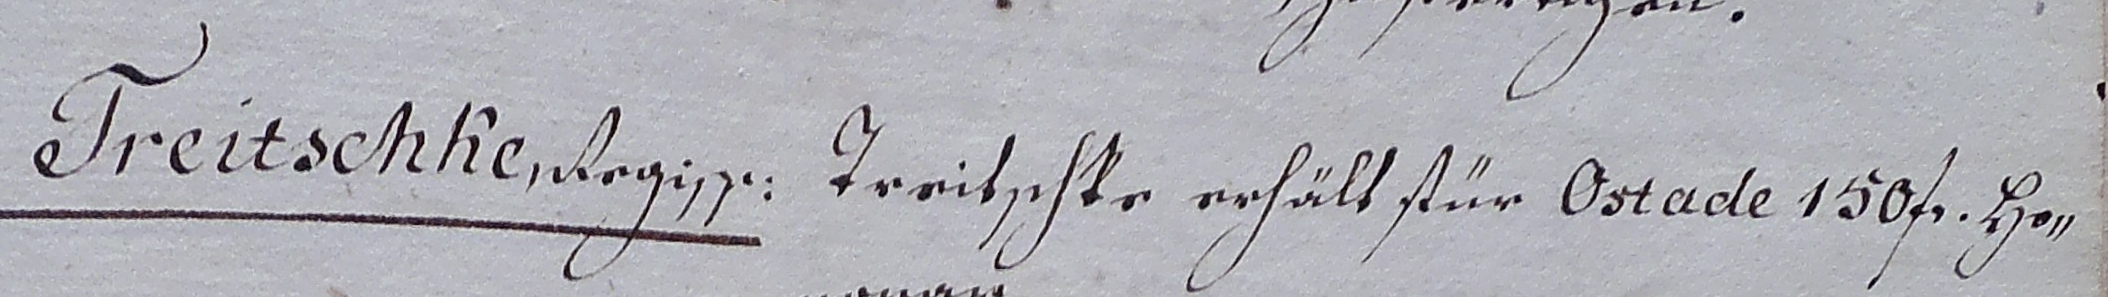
Treitschke, Regiss: Treitschke erhält für Oastade 150fr. Ho¬
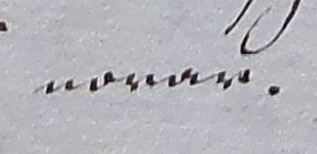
norar.
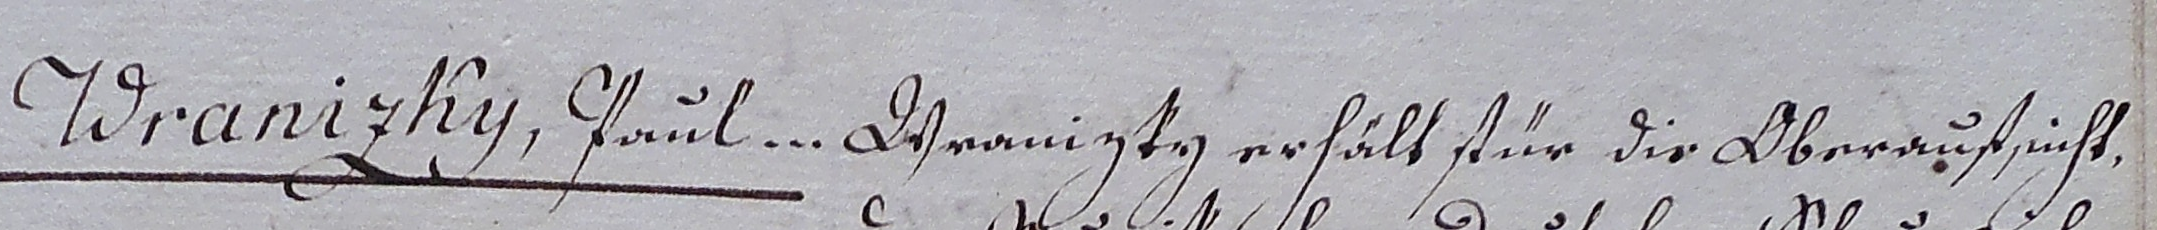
Wranizky, Paul ... Wranizky erhält für die Oberaufsicht,
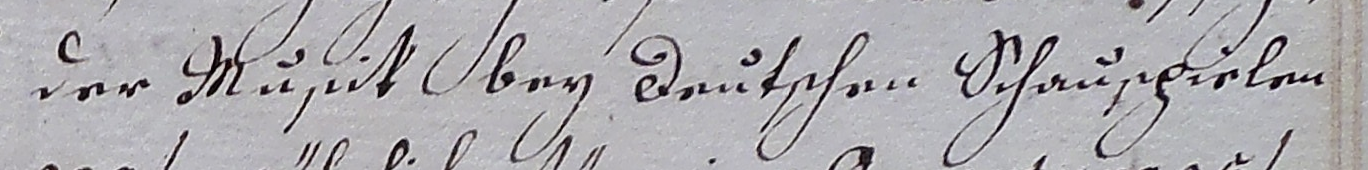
der Music bey deutschen Schauspielen
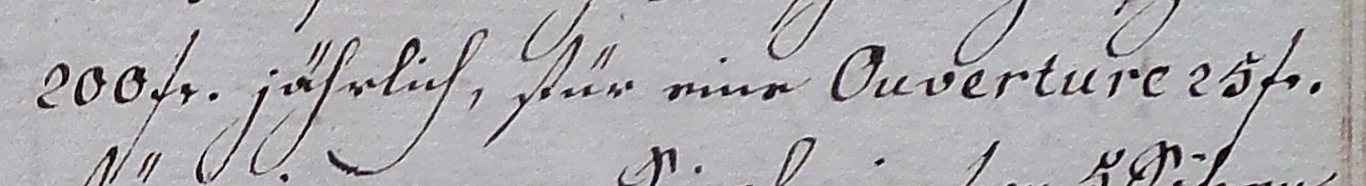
200fr. jährlich, für eine Ouverture 25fr.
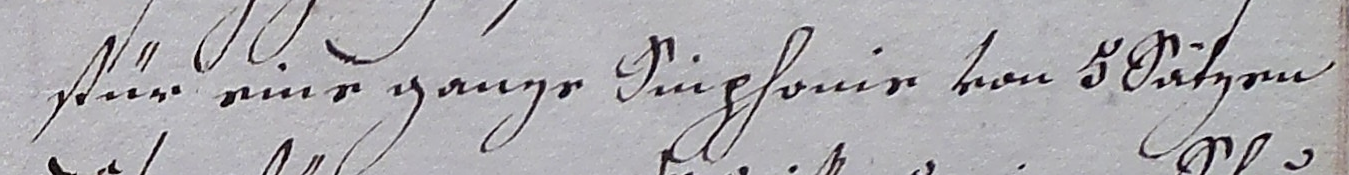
für eine ganze Sinphonie von 5 Sätzen
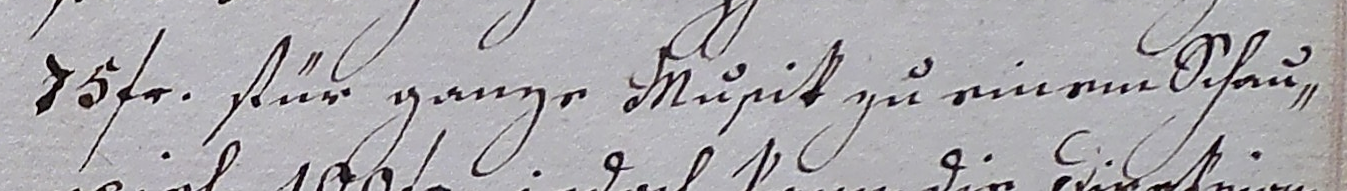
75fr. für ganze Musik zu einem Schau¬
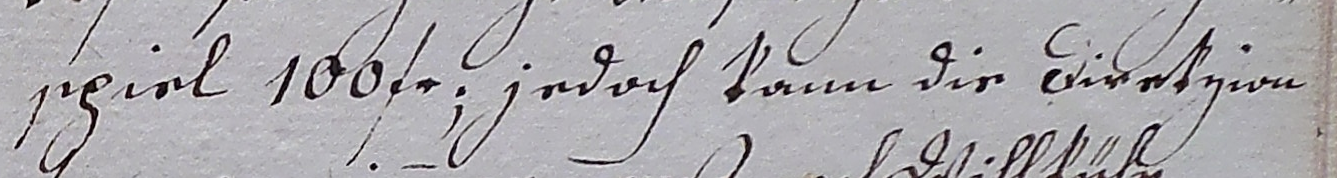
spiel 100fr.; jedoch kann die Direkzion
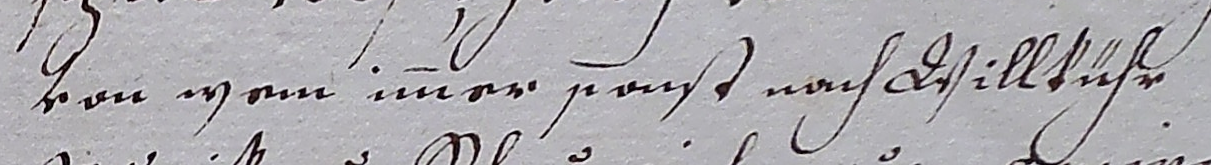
von wem im̅er sonst nach Willkühr
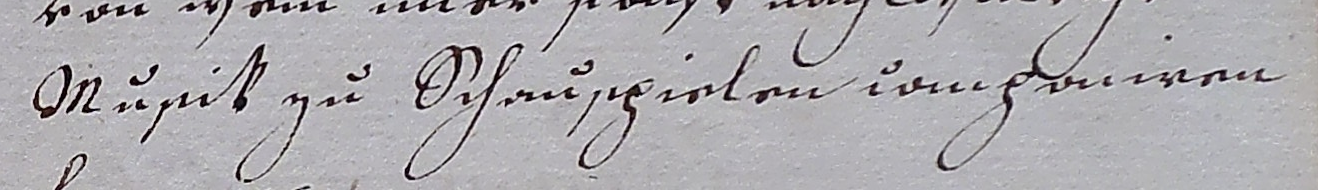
Musik zu Schauspielen componiren
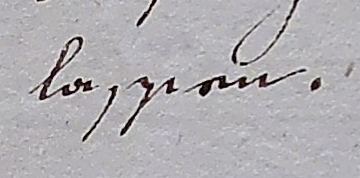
lassen.
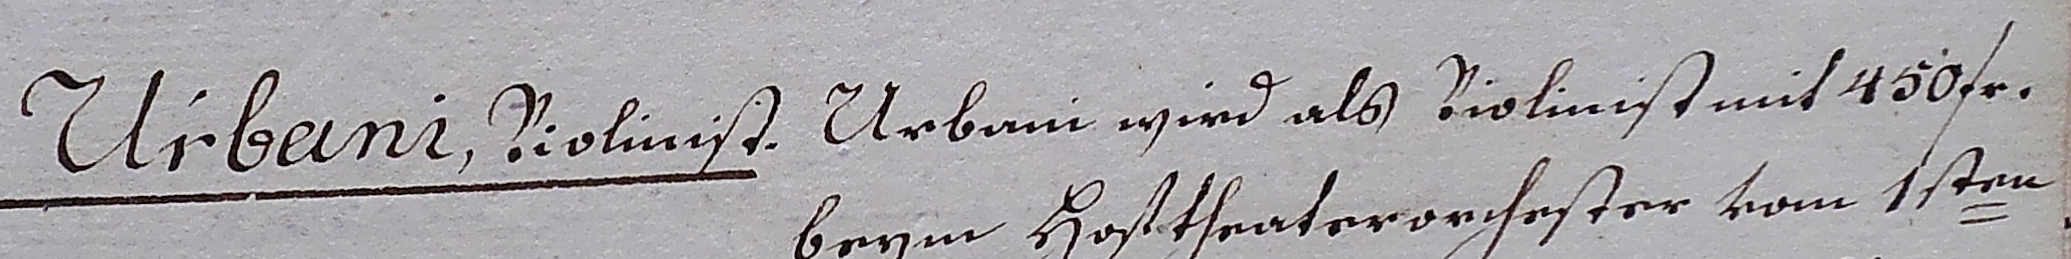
Urbani, Violinist. Urbani wird als Violinist mit 450fr.
